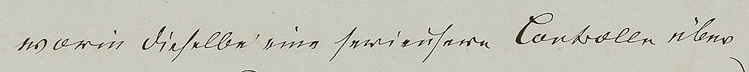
worin dieselbe eine serieusere Controlle über
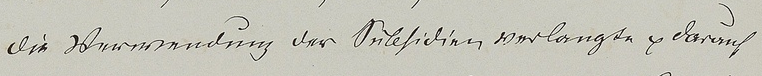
die Verwendung der Subsidien verlangte & darauf
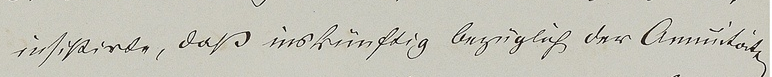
insistirte, daß inskünftig bezüglich der Annuitäten
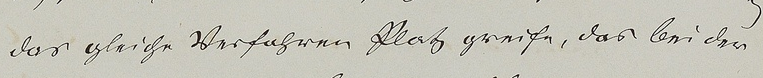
das gleiche Verfahren Platz greife, das bei der
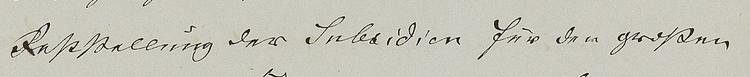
Feststellung der Subsidien für den großen
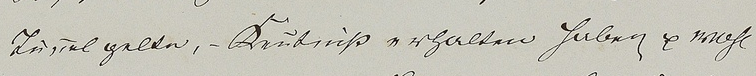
Tunnel gelte, – Kenntniß erhalten haben & wohl
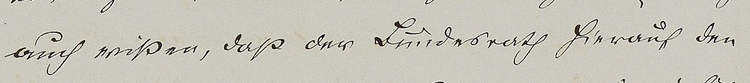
auch wißen, daß der Bundesrath hierauf den
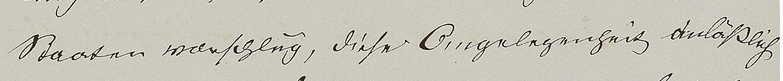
Staaten vorschlug, diese Angelegenheit anläßlich
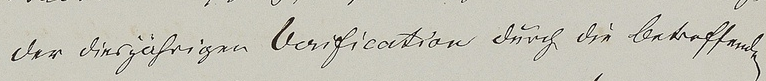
der diesjährigen Verification durch die betreffenden
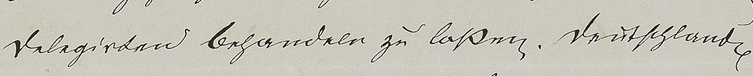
Delegirten behandeln zu laßen. Deutschland &
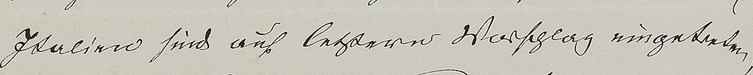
Italien sind auf letztern Vorschlag eingetreten;
